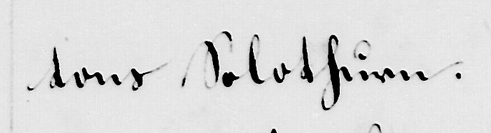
tons Solothurn.
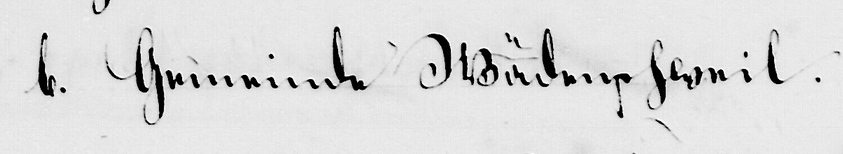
b. Gemeinde Wädenschweil.
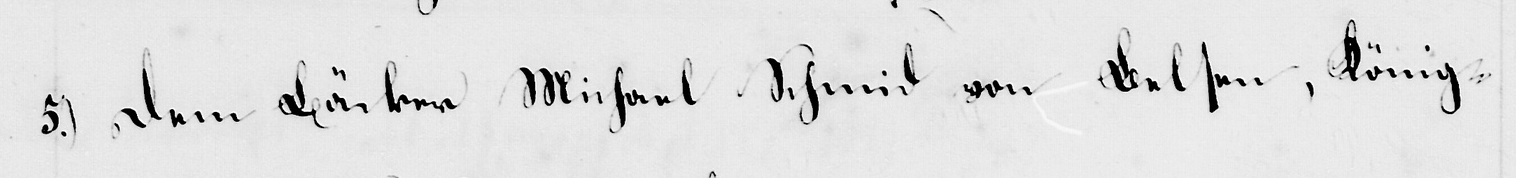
5.) dem Bäcker Michael Schmid von Belsen, König¬
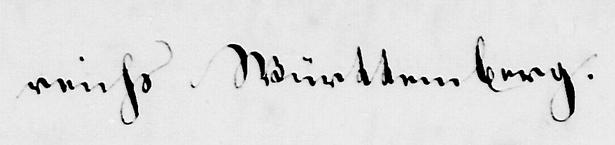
reichs Württemberg.
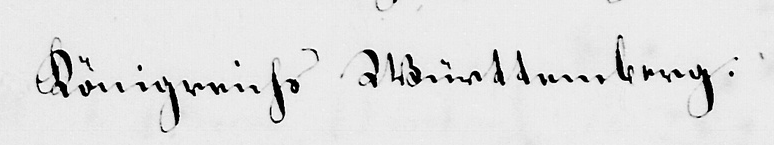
Königreichs Württemberg.
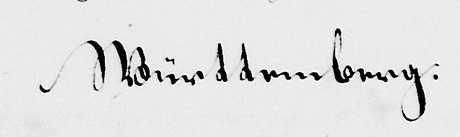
Württemberg.
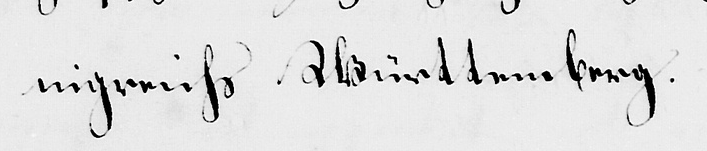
nigreichs Württemberg.
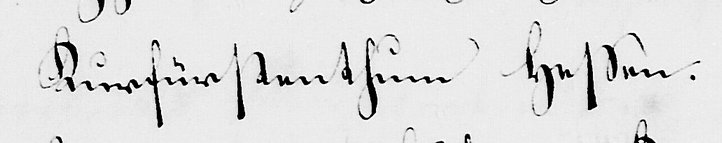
Kurfürstenthum Heßen.
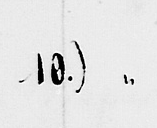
11.)
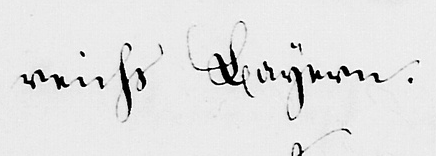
reichs Bayern.
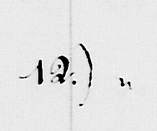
12.)
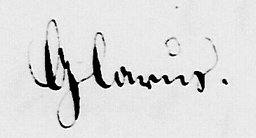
Glarus.
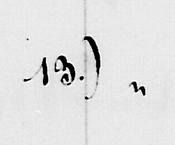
15.)
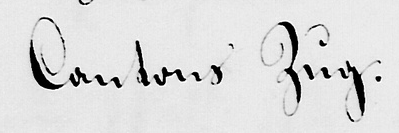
Cantons Zug.
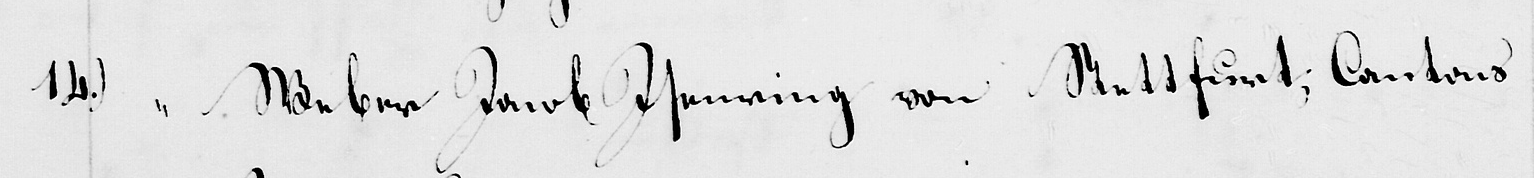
14.) " Weber Jacob Isenring von Stettfurt, Cantons
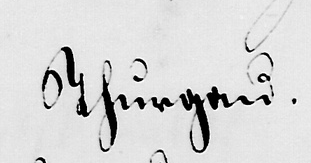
Thurgau.
